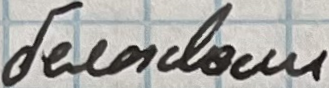белохвост
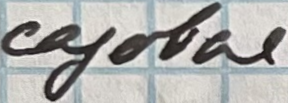садовая
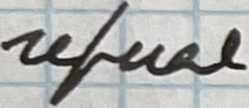черная
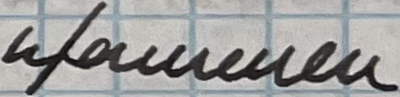кроншнеп
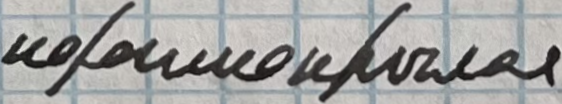короткокрылая
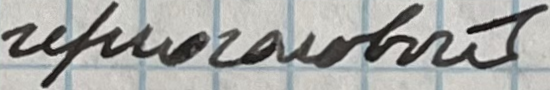черноголовый
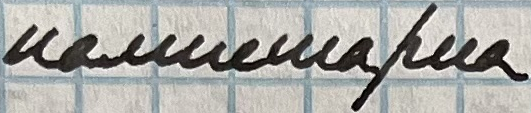камнешарка
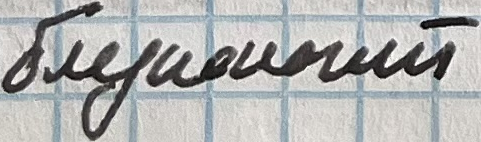бледноногий
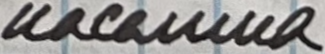касатка
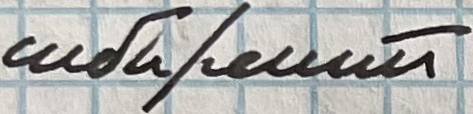сибирский
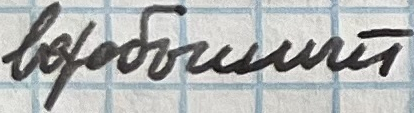воробьиный
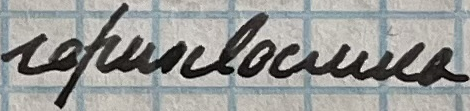горихвостка
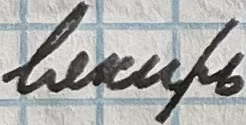вяхирь
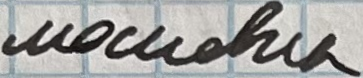московка
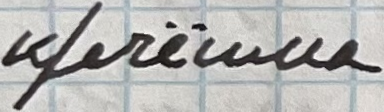кречётка
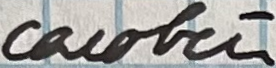соловей
